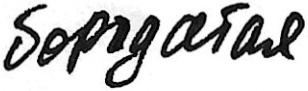бородатая
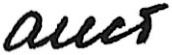аист
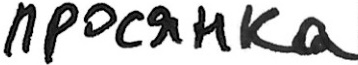просянка
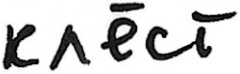клёст
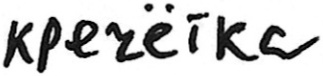кречётка
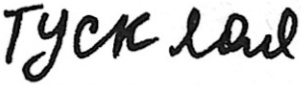тусклая
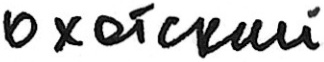охотский
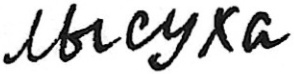лысуха
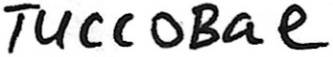тиссовая
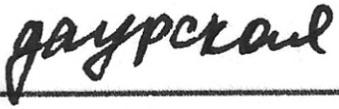даурская
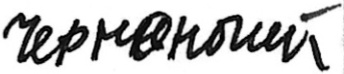черноногий
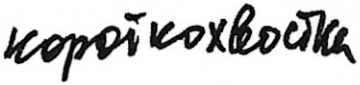короткохвостка
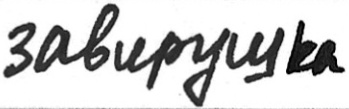завирушка
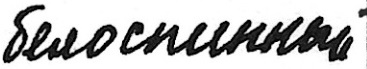белоспинный
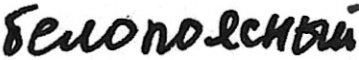белопоясный
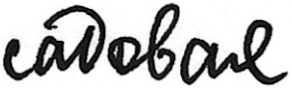садовая
